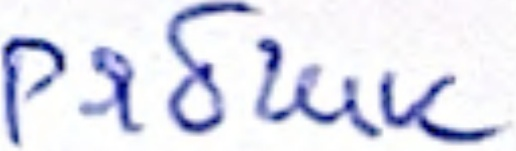рябчик
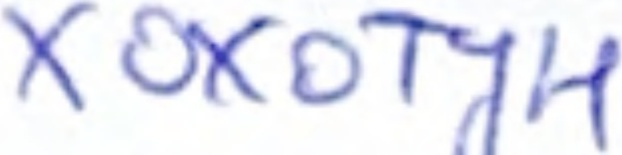хохотун
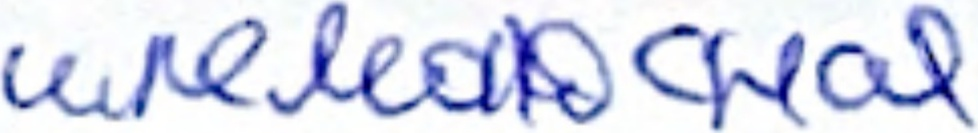шлемоносная
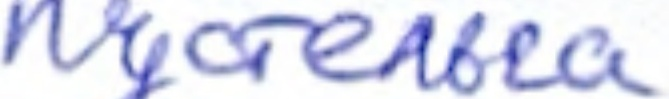пустельга
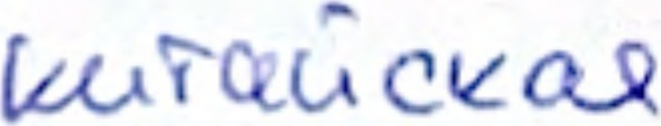китайская
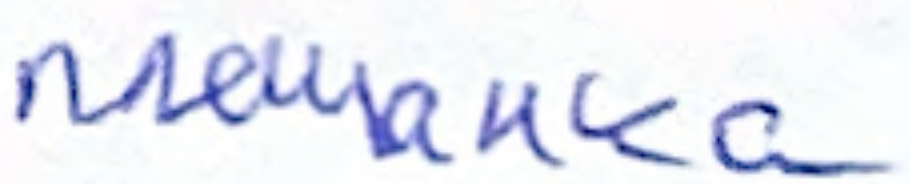плешанка
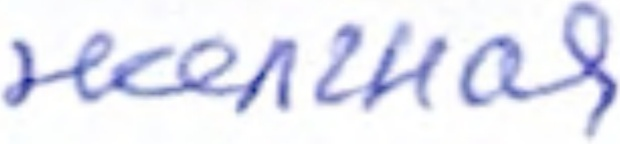желчная
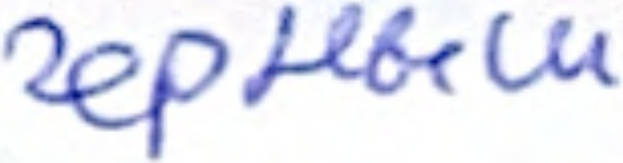черныш
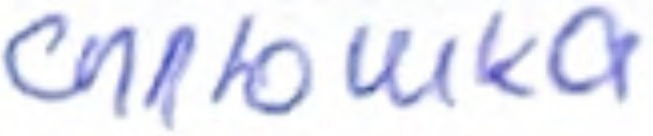сплюшка
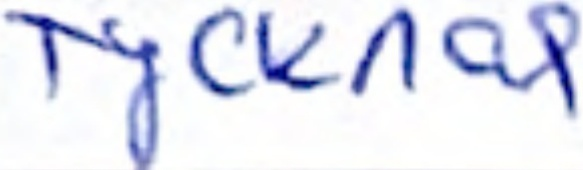тусклая
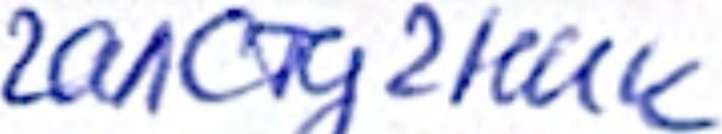галстучник
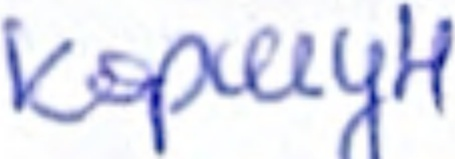коршун
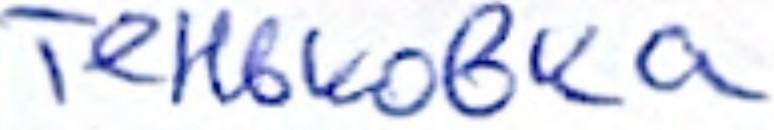теньковка
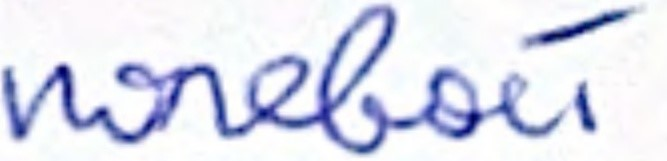полевой
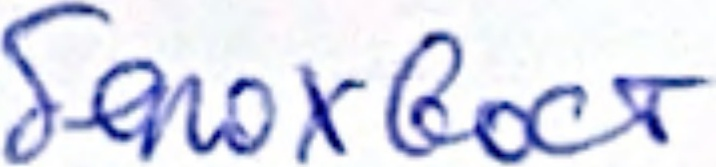белохвост
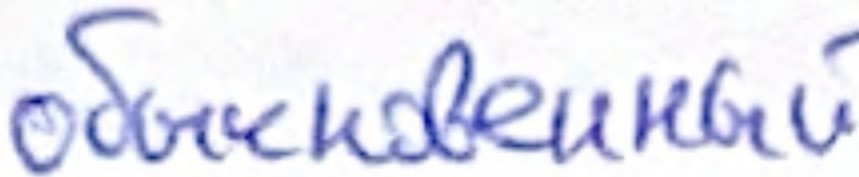обыкновенный
